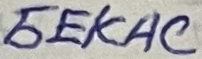бекас
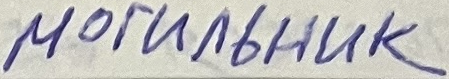могильник
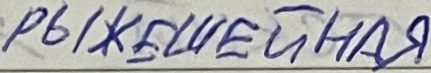рыжешейная
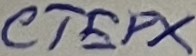стерх
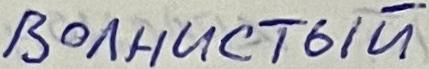волнистый
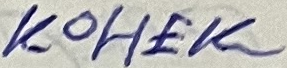конек
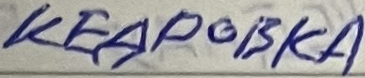кедровка
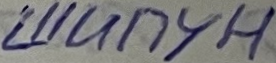шипун
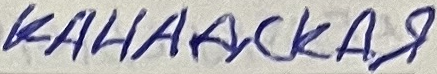канадская
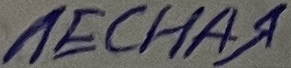лесная
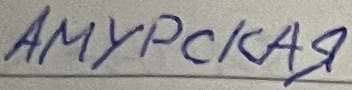амурская
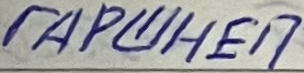гаршнеп
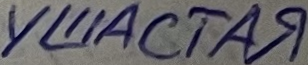ушастая
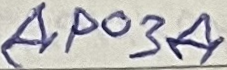дрозд
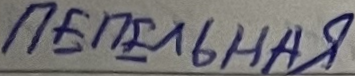пепельная
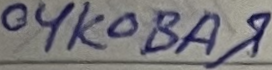очковая
